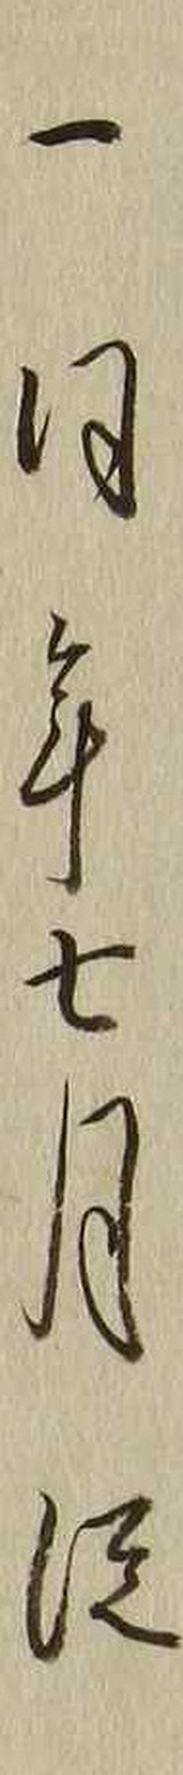一同年七月従
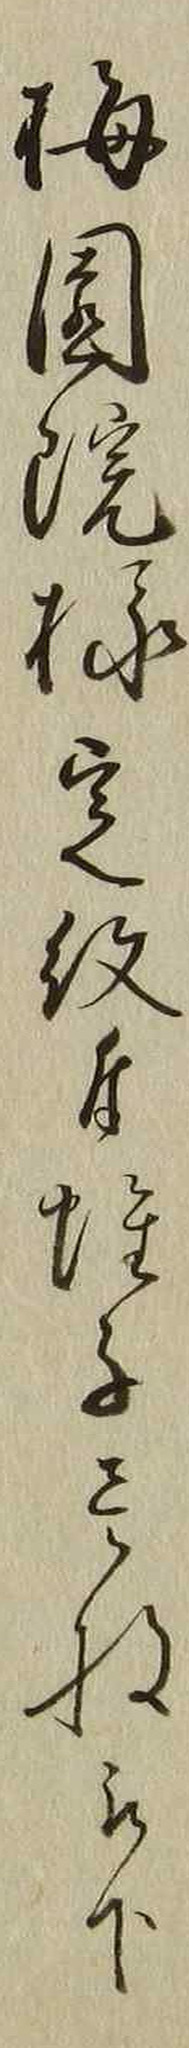梅園院様定紋付帷子壱枚被下
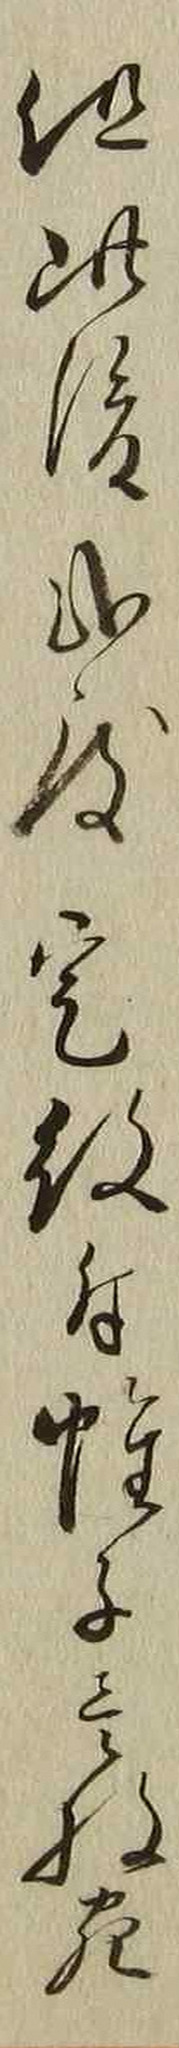但此後弐度定紋付帷子壱枚宛
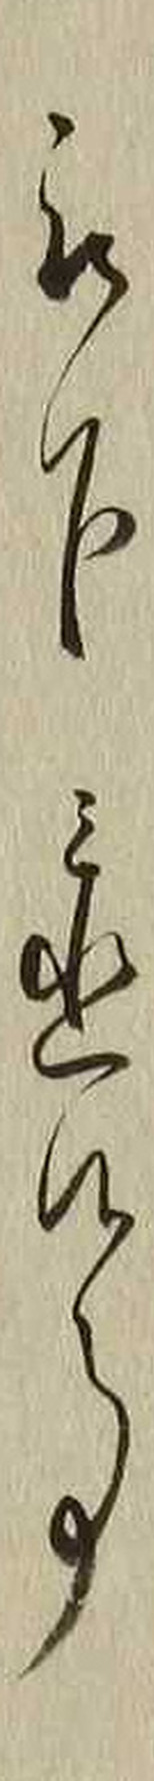被下置候事
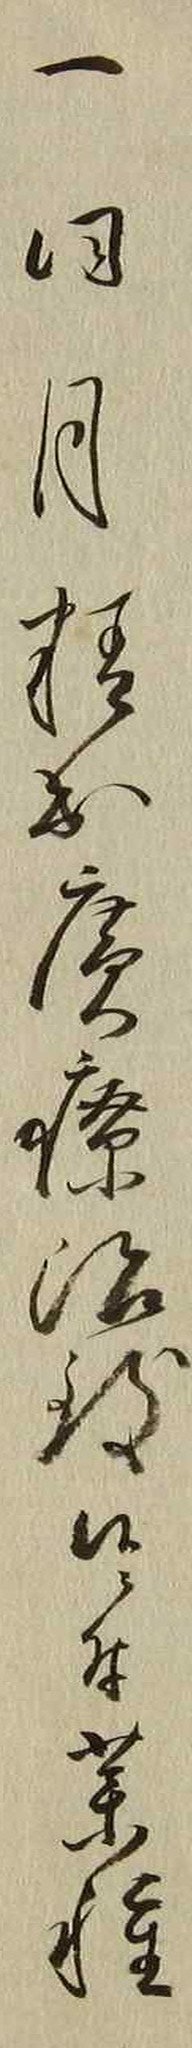一同月精出広療治致候ニ付薬種
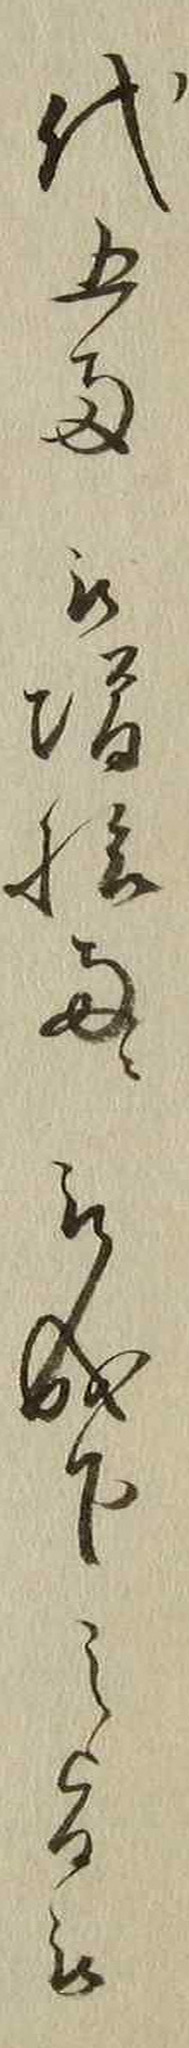代五両被増拾両ニ被成下之旨被
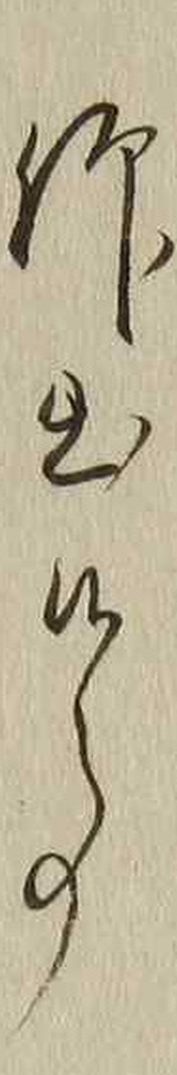仰出候事
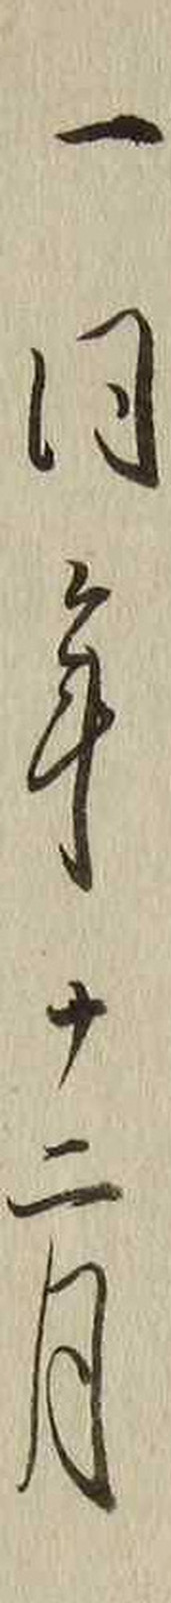一同年十二月
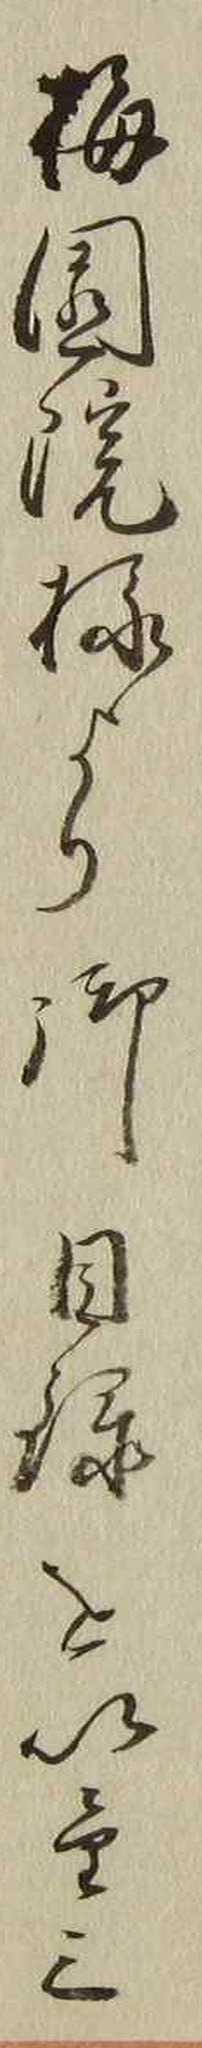梅園院様より御目録を以金三
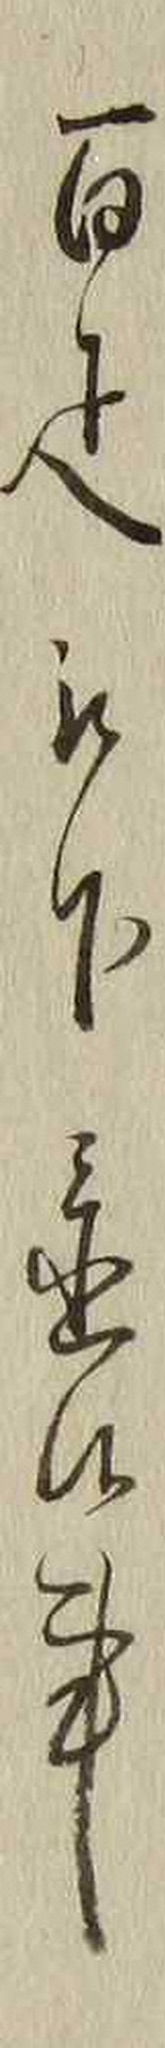百疋被下置候事
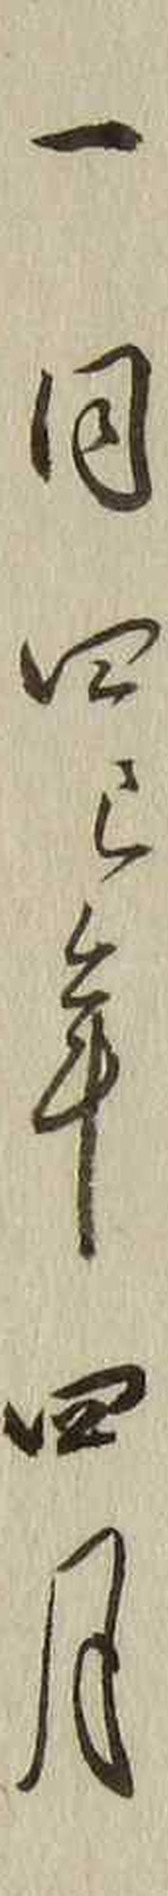一同四巳年四月
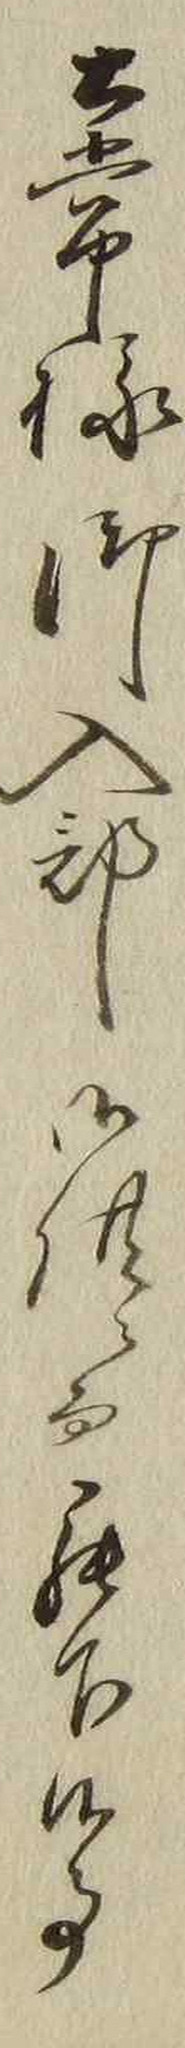土常様御入部御供ニ而罷下候事
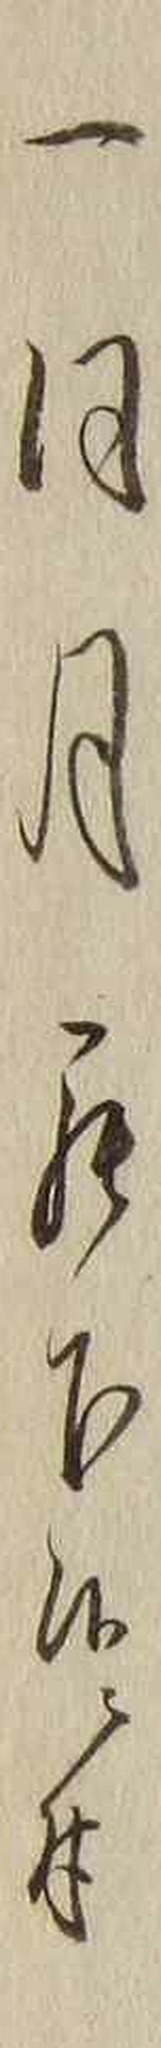一同月罷下候ニ付
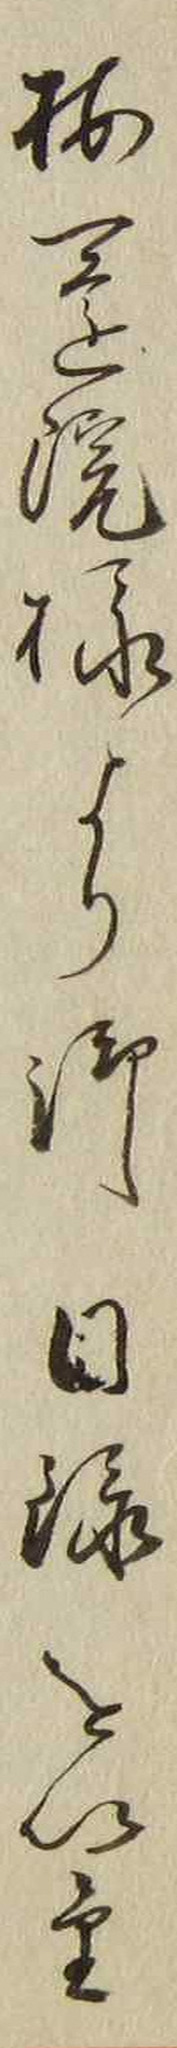梅園院様より御目録を以金
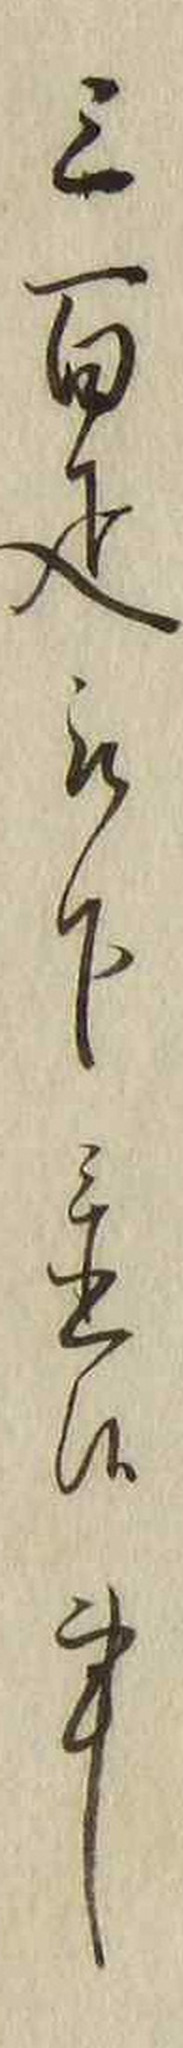三百疋被下置候事

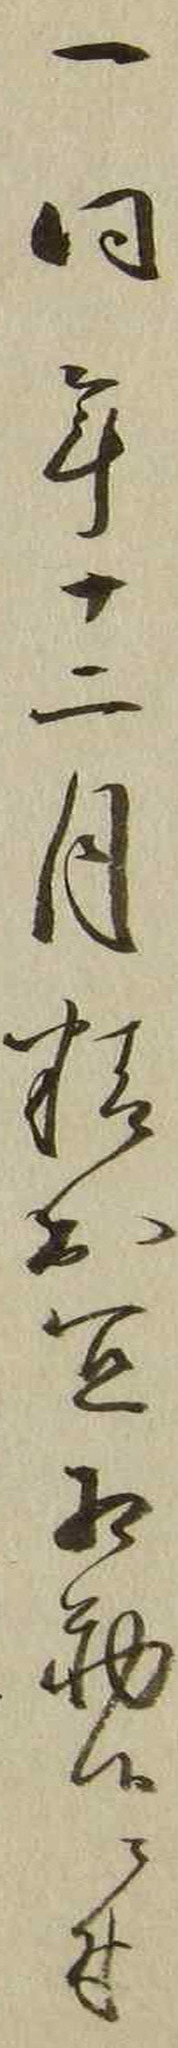一同年十二月精出宜相勤候ニ付
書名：諸士系譜　巻之68　を之部2
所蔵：会津若松市立会津図書館
